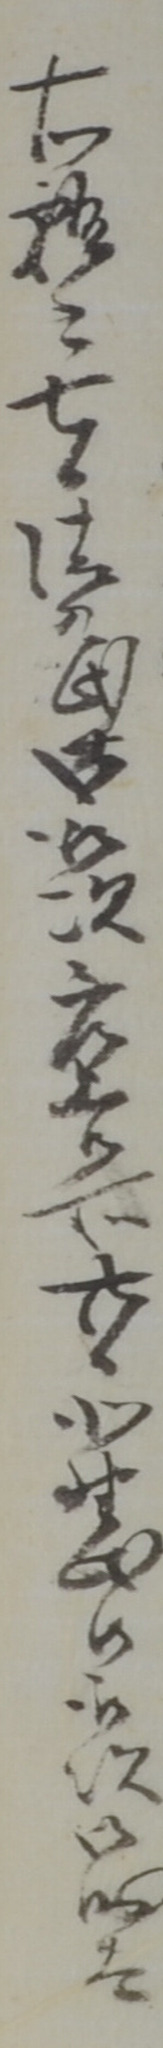右願書七日清水氏御取次差上候所廿日北野氏御取次御沙太
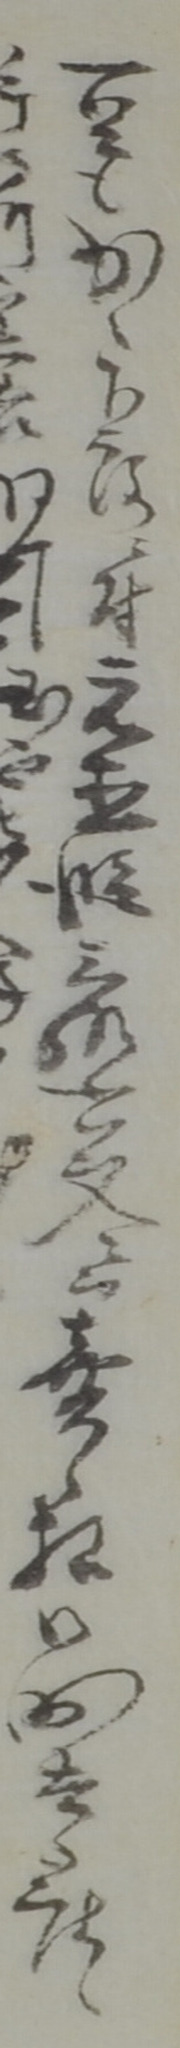豆も少し下落ニ付元直段三拾六文ニ而売候様御沙太御座候
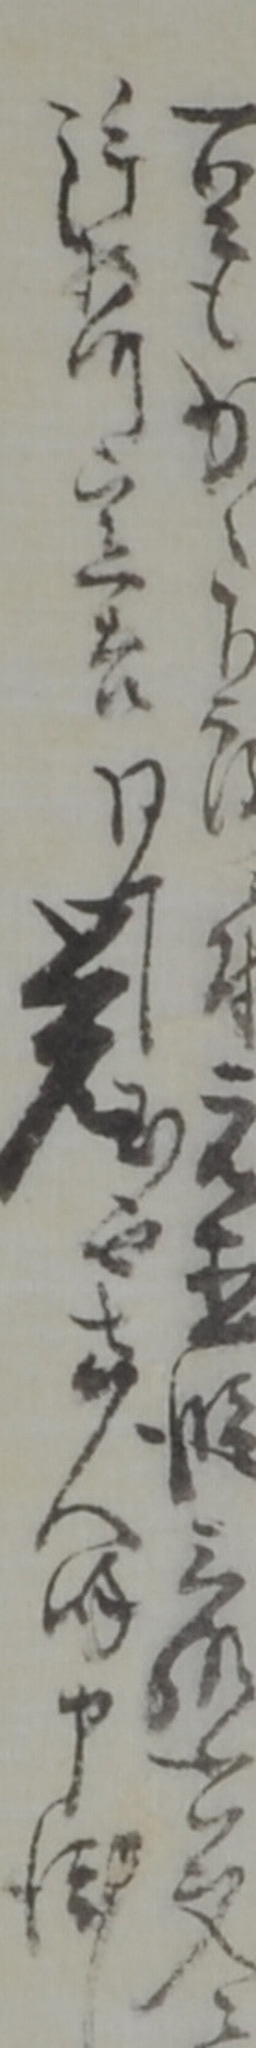鉾持町定吉同丁玉や両人呼申渡候
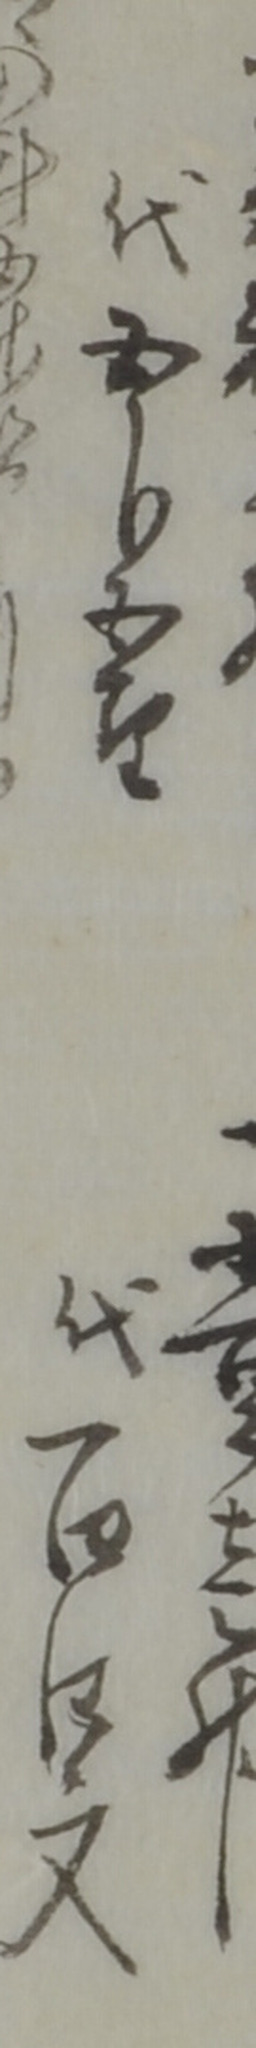代五分五厘代百四文
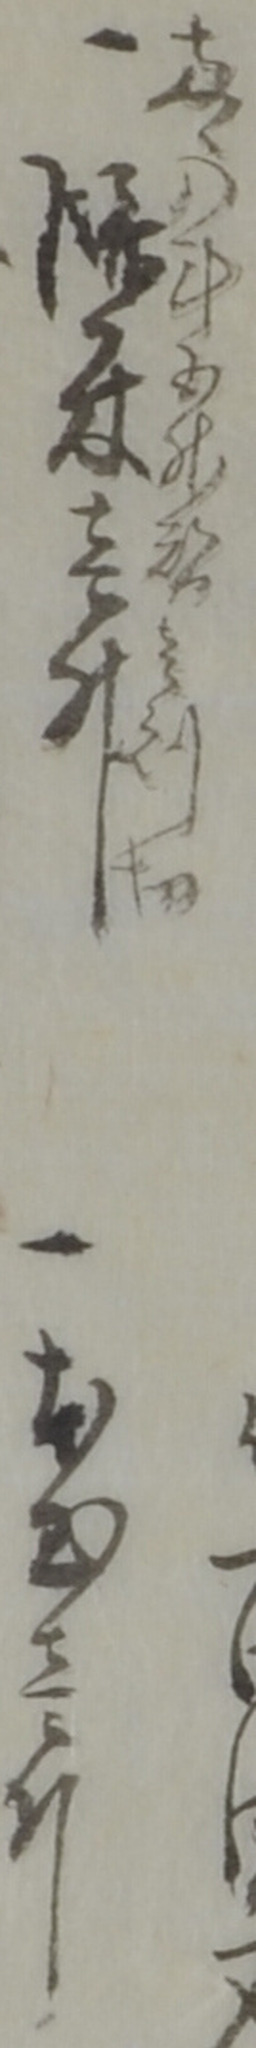一餅米壱升一本玉壱升
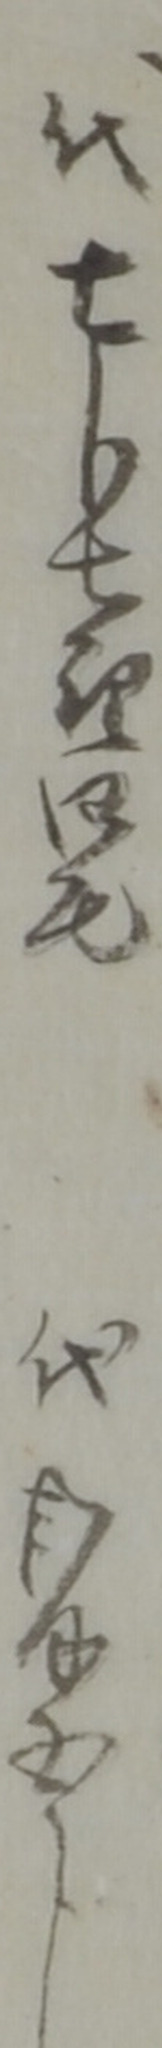代七分七厘四毛代弐匁五分
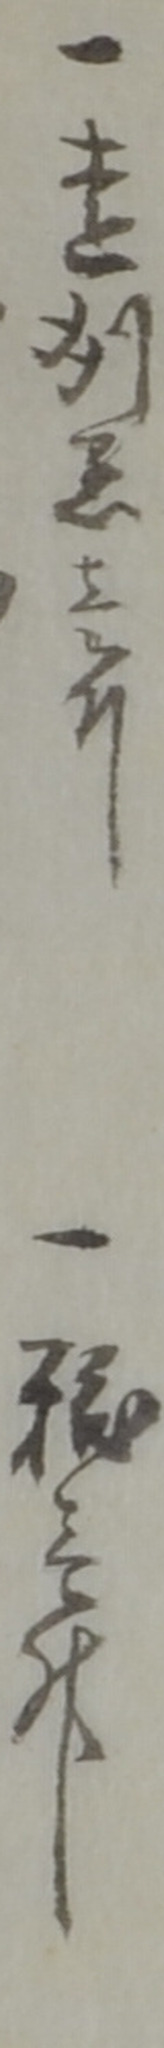一遠州黒壱升一糀壱升
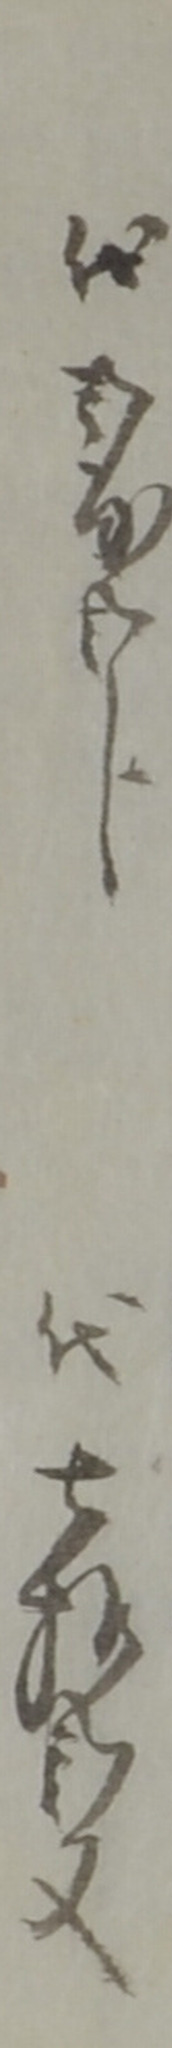代弐匁弐分代七拾弐文
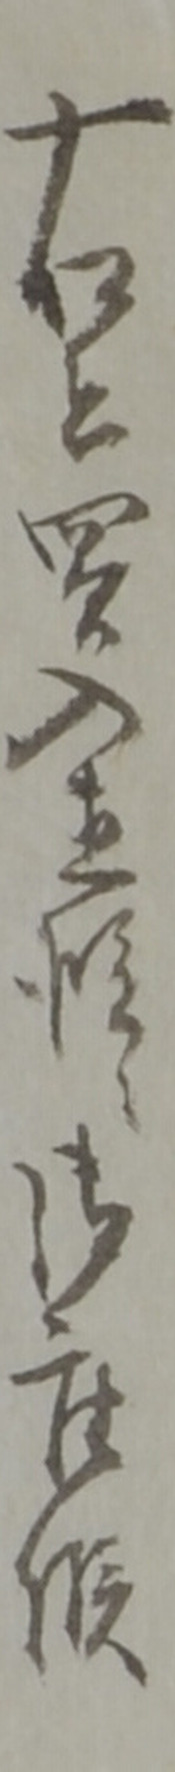右者買入直段ニ御座候
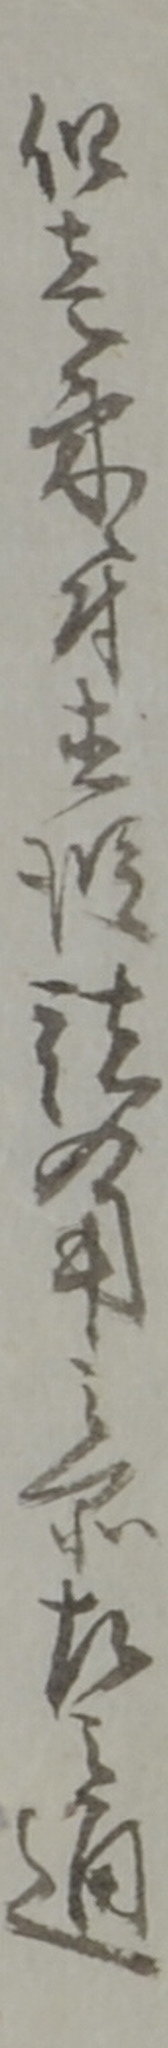但壱束ニ付直段請入用之品左之通
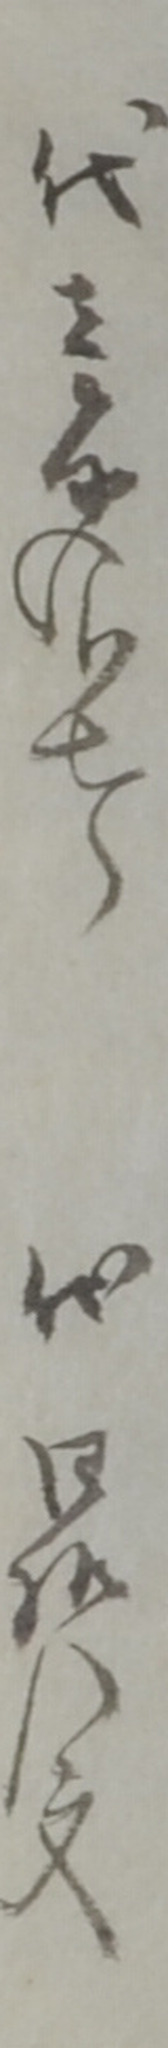代壱匁八分七厘代四拾八文

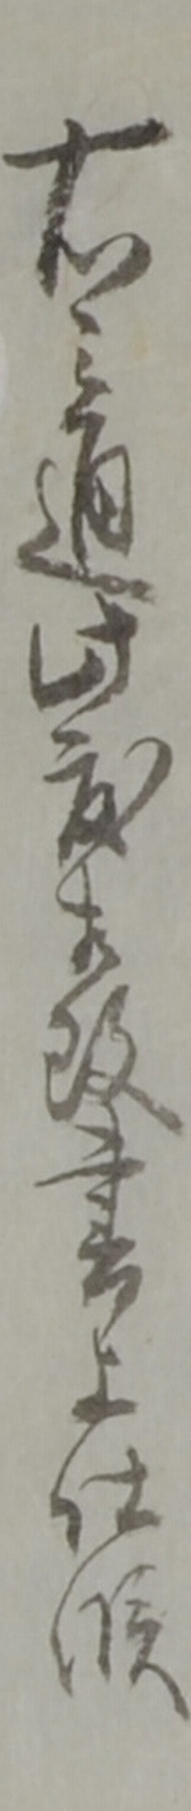右之通此度相改書上仕候
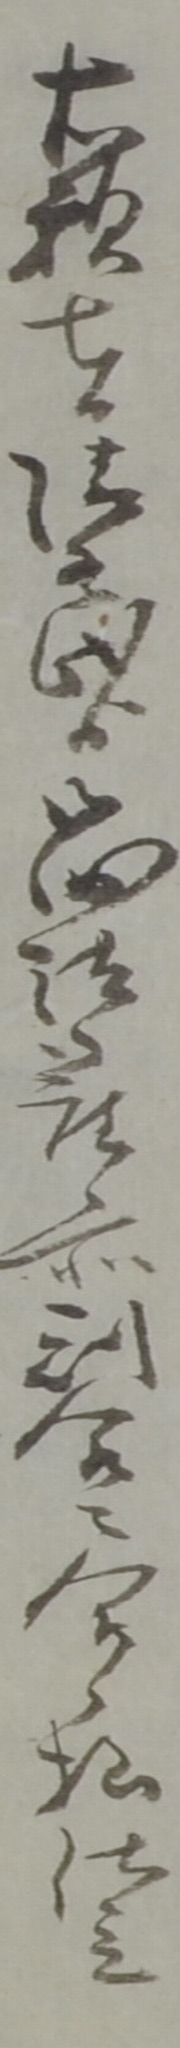右願七日清水氏ゟ御沙汰御座候所刻合ニ合候様仕立
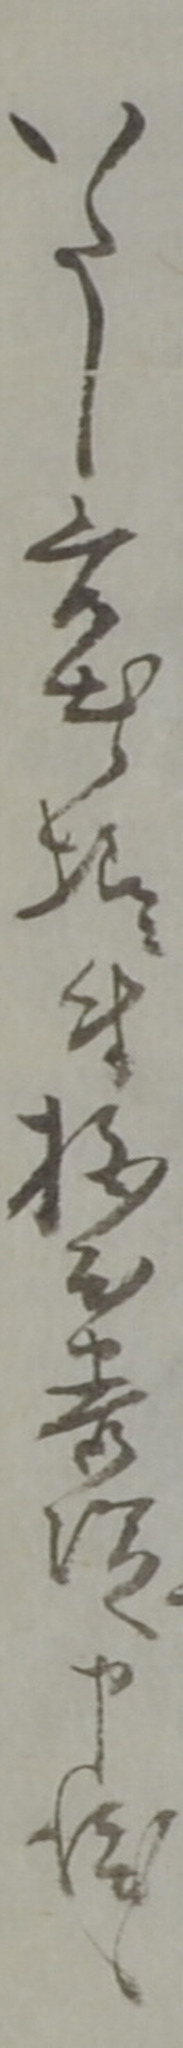いたし差出候様ニ付柏屋治へ申渡候
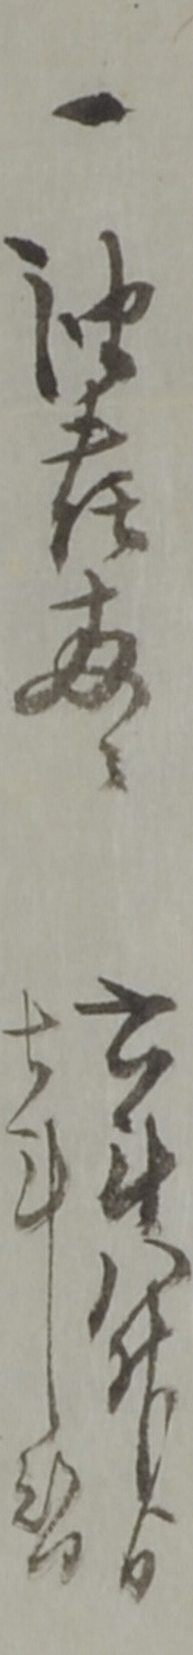一油荏両ニ六斗八升ゟ
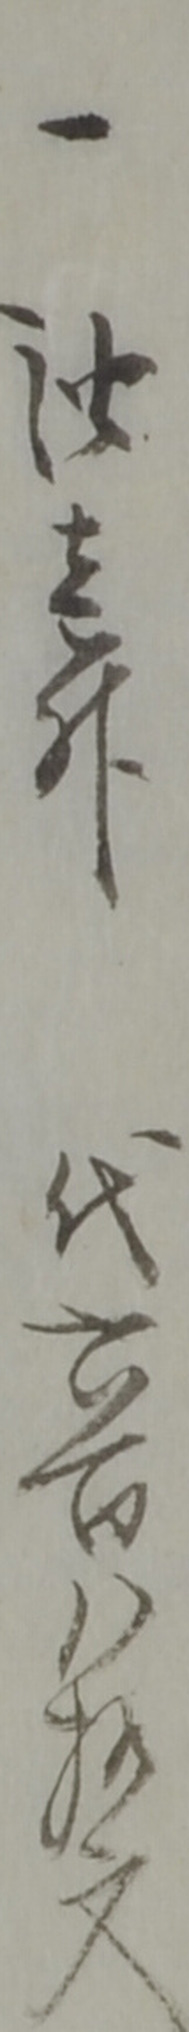一油壱升代六百八拾文
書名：諸願書控簿
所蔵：伊那市立高遠町図書館・合同会社AMANE
